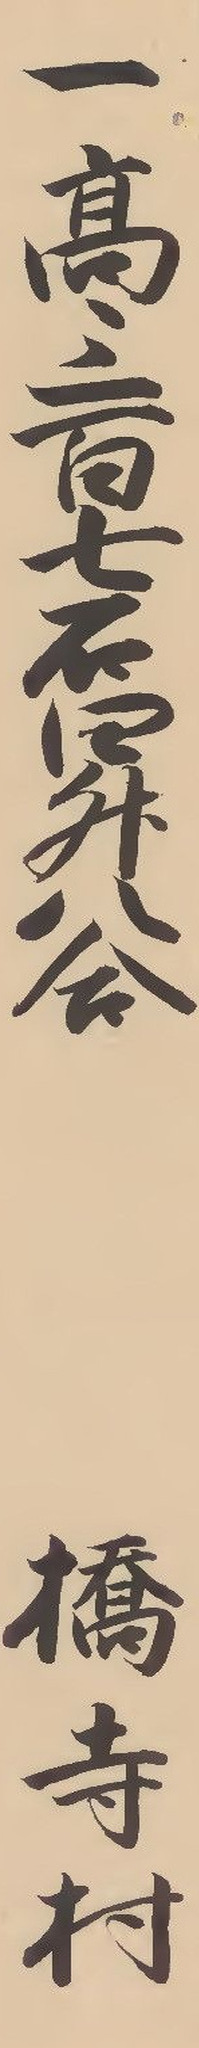一高三百七石四升八合橋寺村
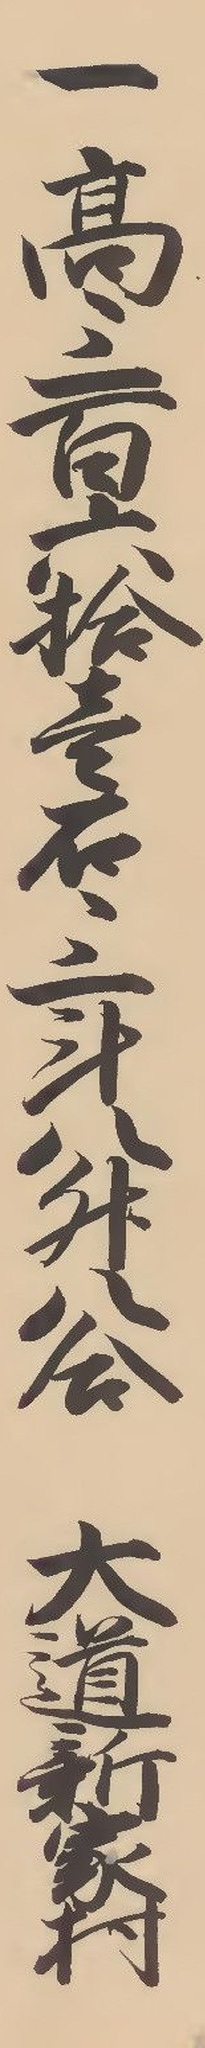一高三百六拾壱石三斗八升八合大道新家村

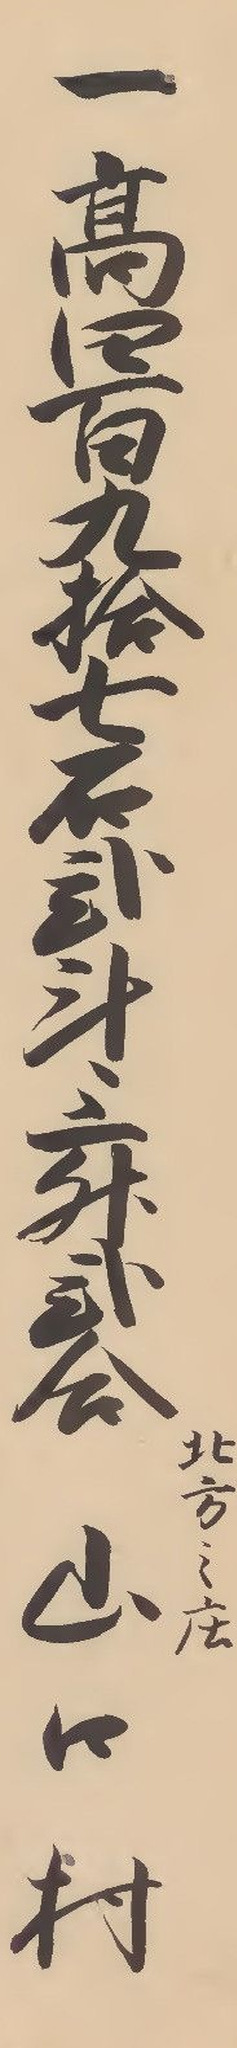一高四百九拾七石弐斗三升弐合山口村
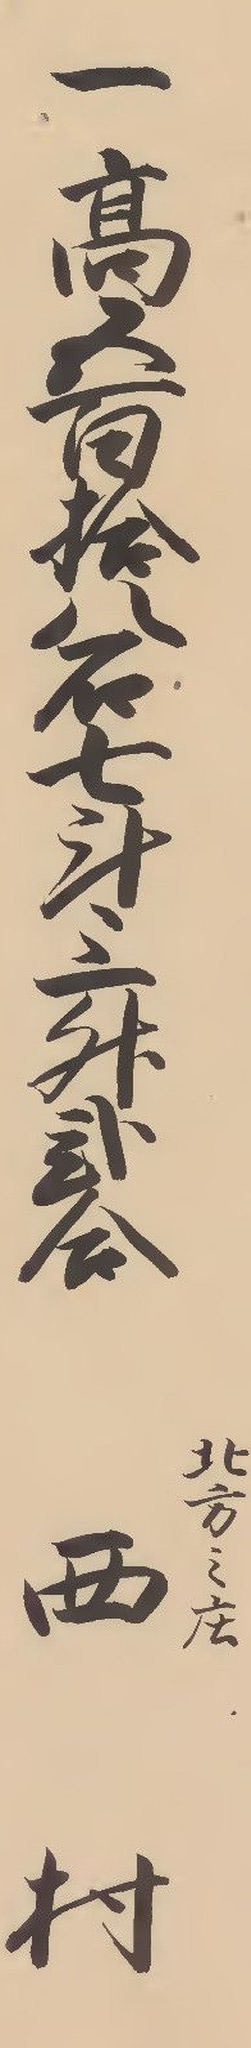一高五百拾八石七斗三升弐合西村
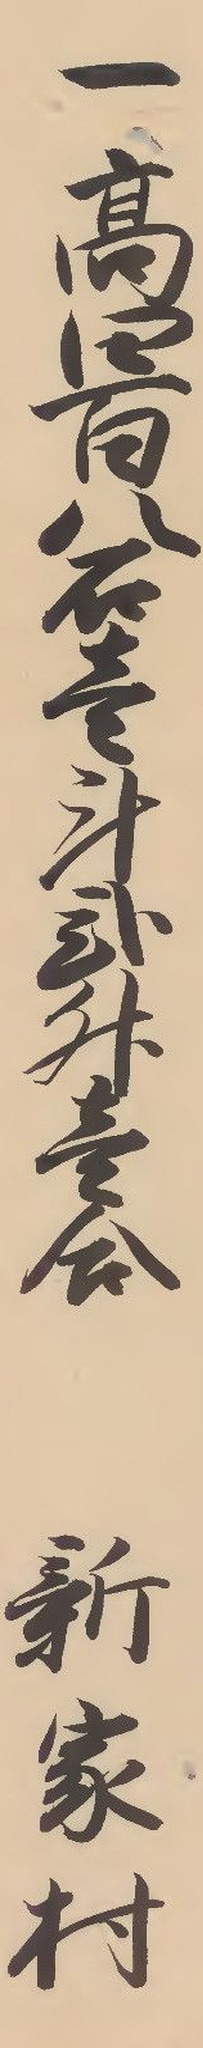一高四百八石壱斗弐升壱合新家村
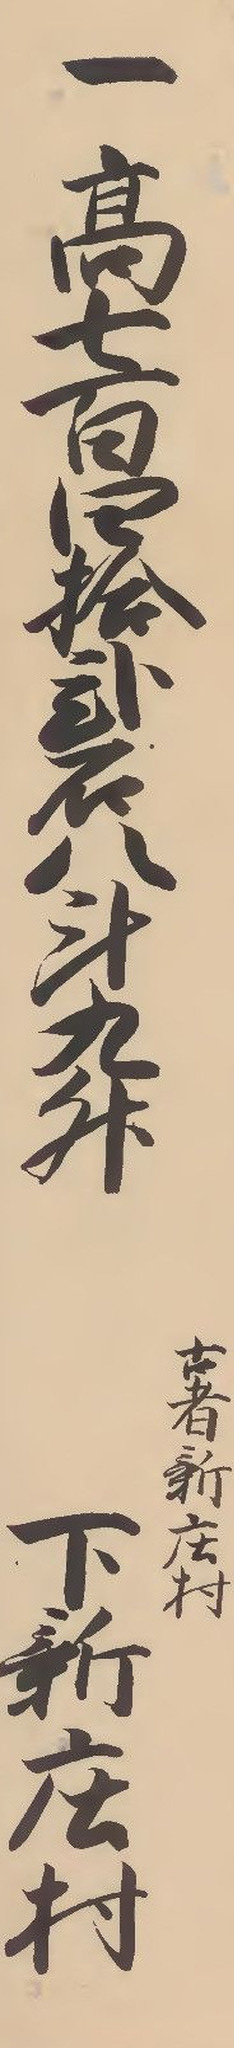一高七百四拾弐石八斗九升下新庄村
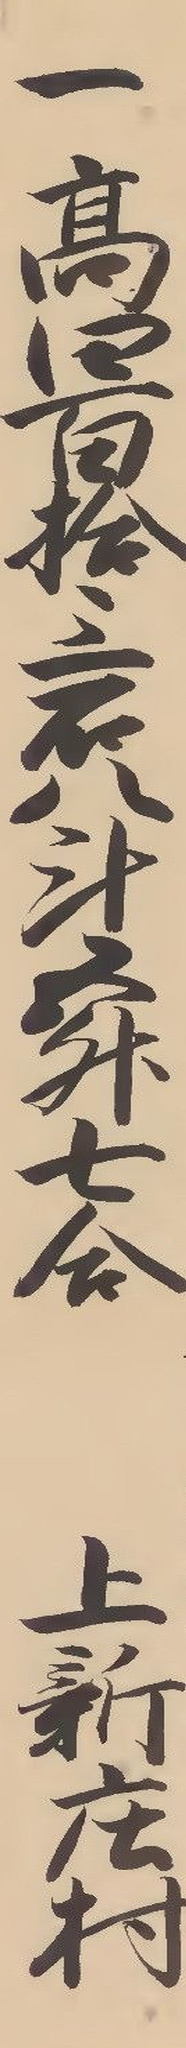一高四百拾三石八斗五升七合上新庄村
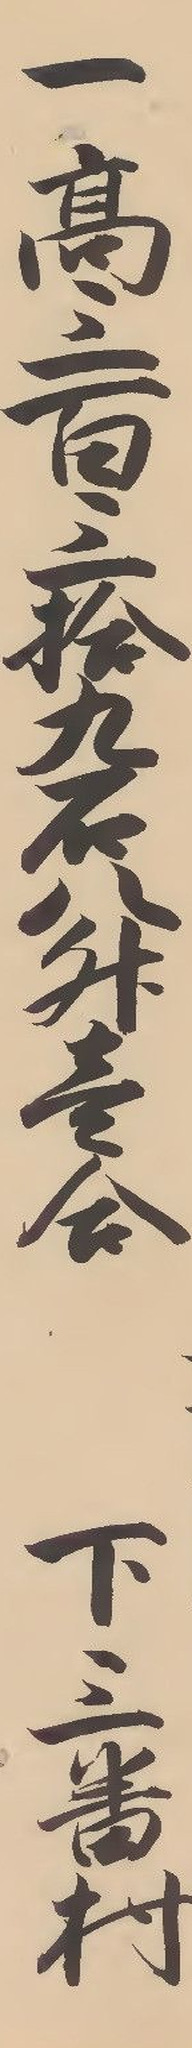一高三百三拾九石八升壱合下三番村
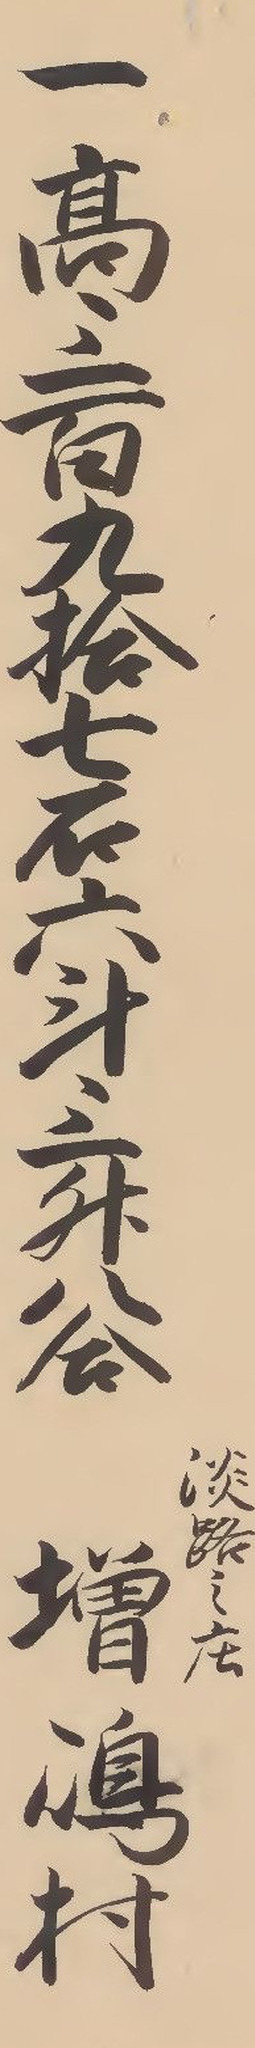一高三百九拾七石六斗三升八合増島村
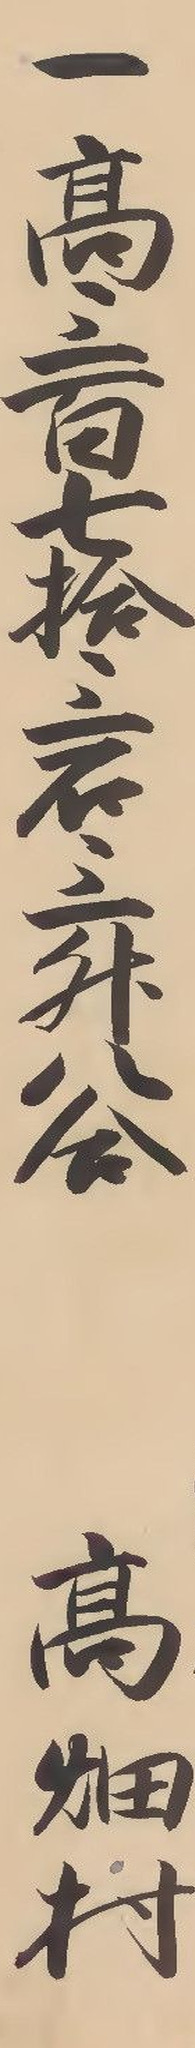一高三百七拾三石三升八合高畑村

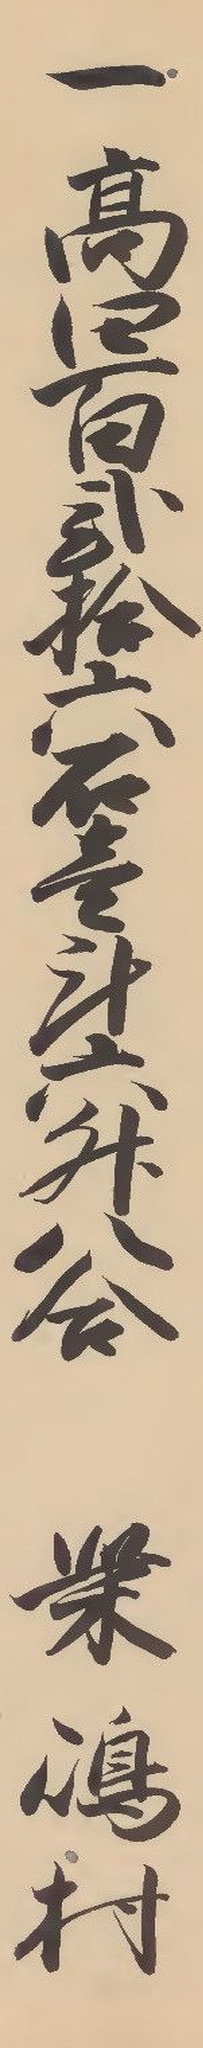一高四百弐拾六石壱斗六升八合柴島村
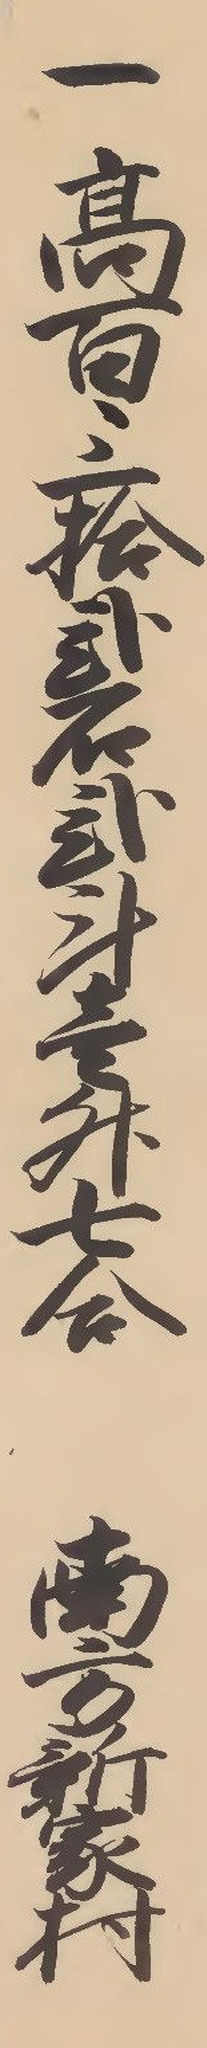一高百三拾弐石弐斗壱升七合南方新家村
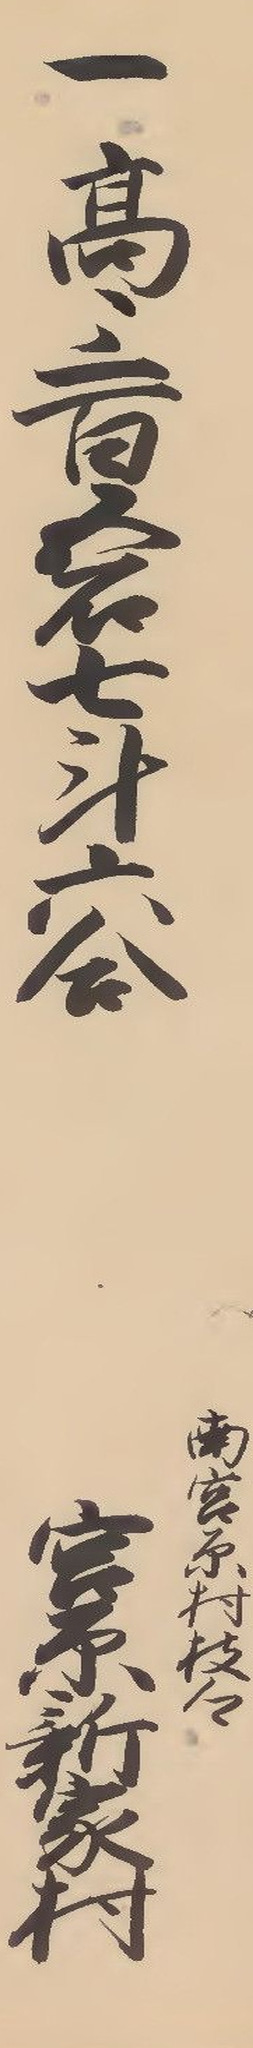一高三百五石七斗六合宮原新家村
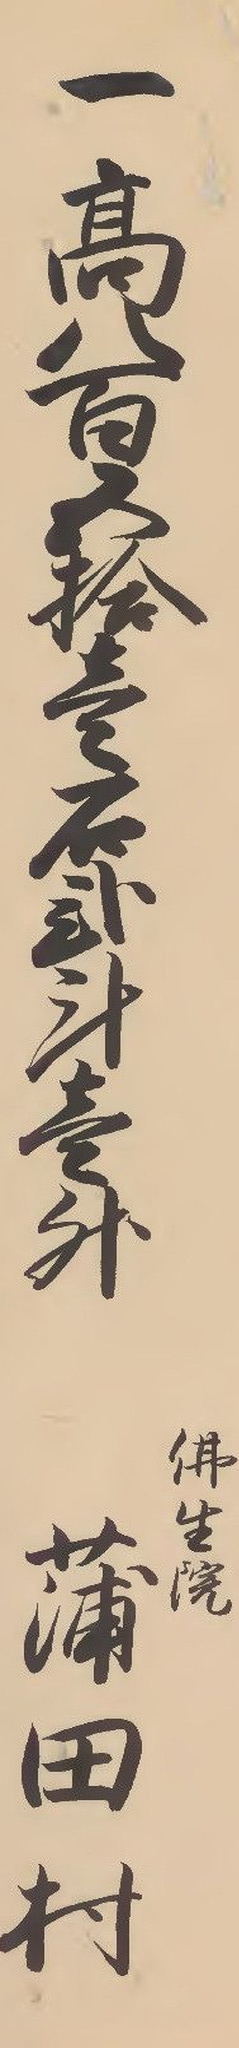一高八百五拾壱石弐斗壱升蒲田村
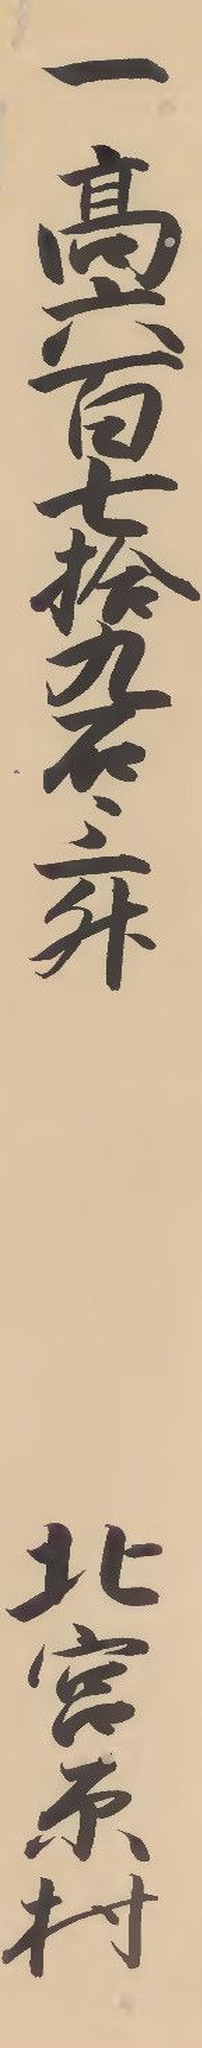一高六百七拾九石三升北宮原村
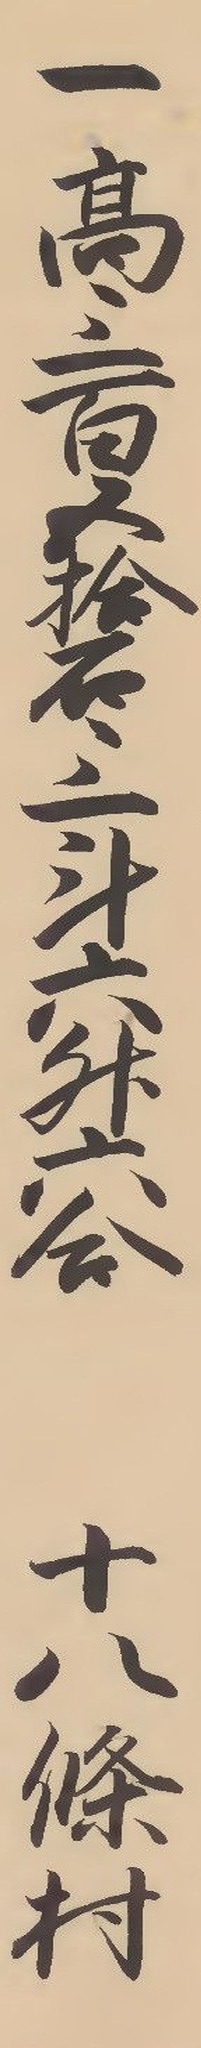一高三百五拾石三斗六升六合十八条村
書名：摂津国郷帳
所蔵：国立公文書館 National Archives of Japan
